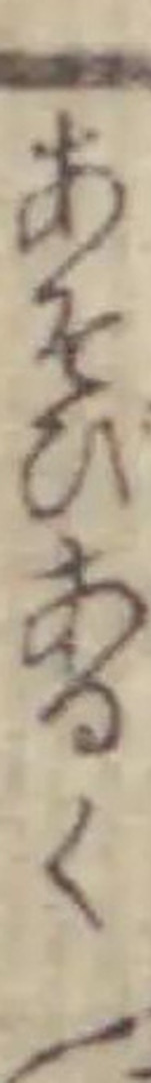あそびあるく
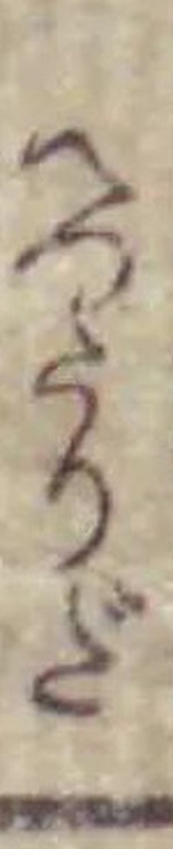へつたりだ
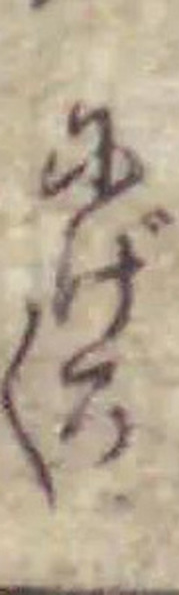にげろ
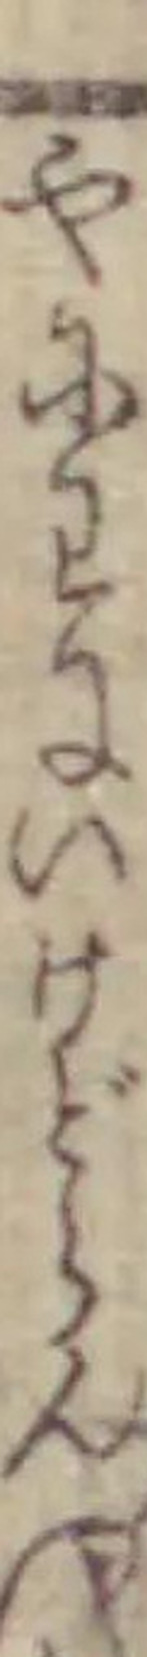やにわにいけどらん
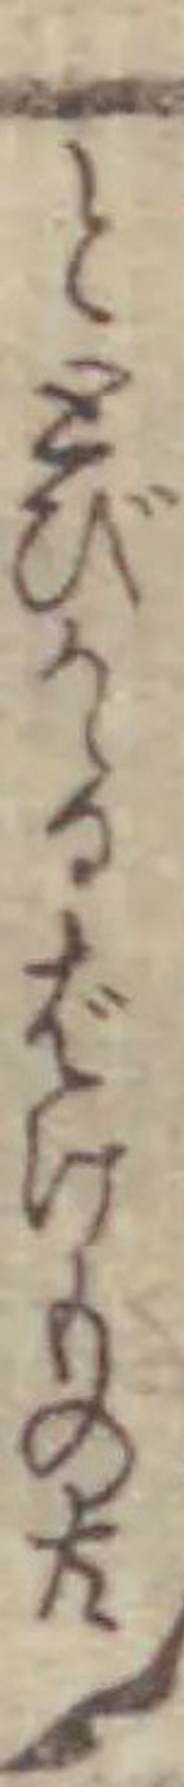ととびかゝるばけもの共
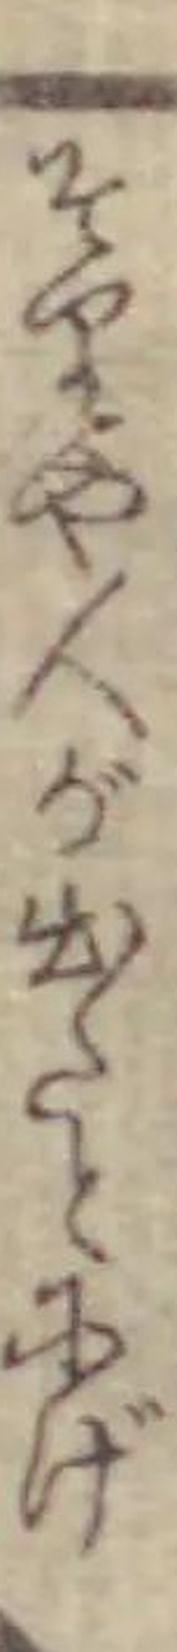そりや人がでたとにげ
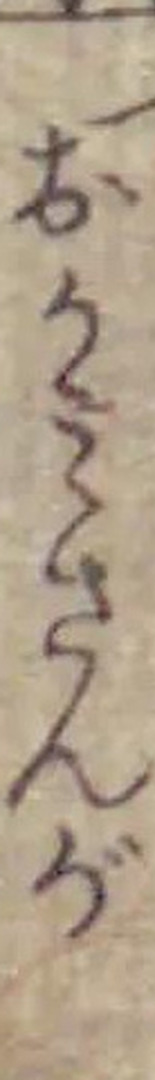〽おかみさんが
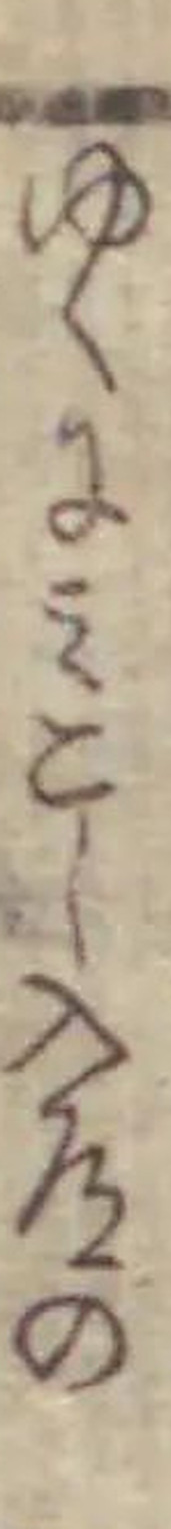ゆくにみこし入道の
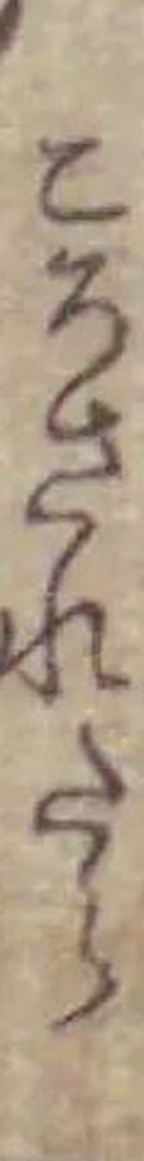ころされたら
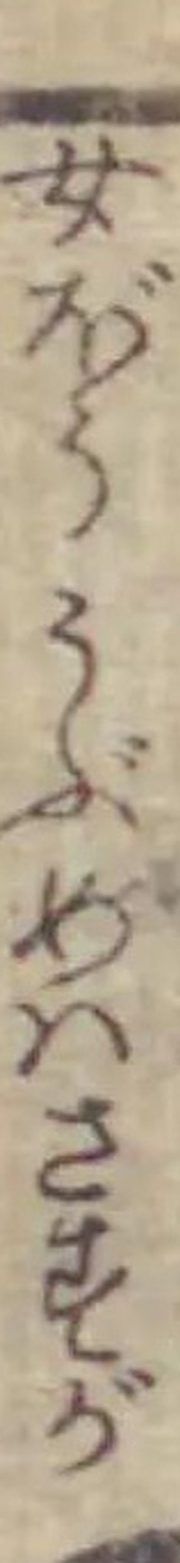女ぼううぶめはさすあ
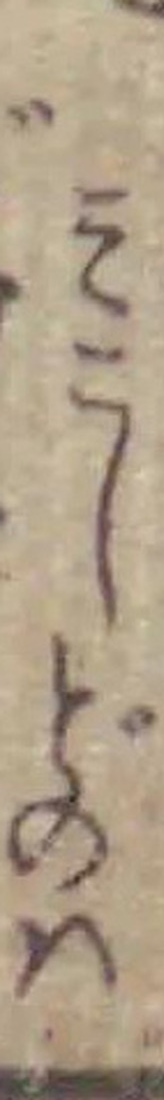みこしどのは
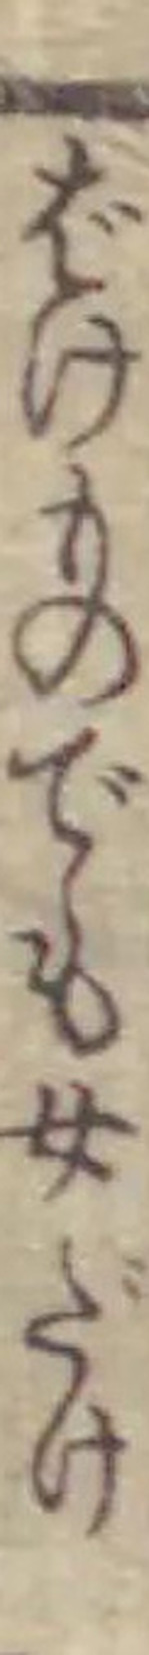ばけものでも女だけ
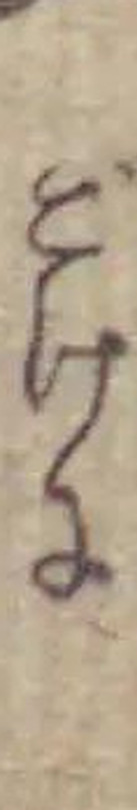ごけに
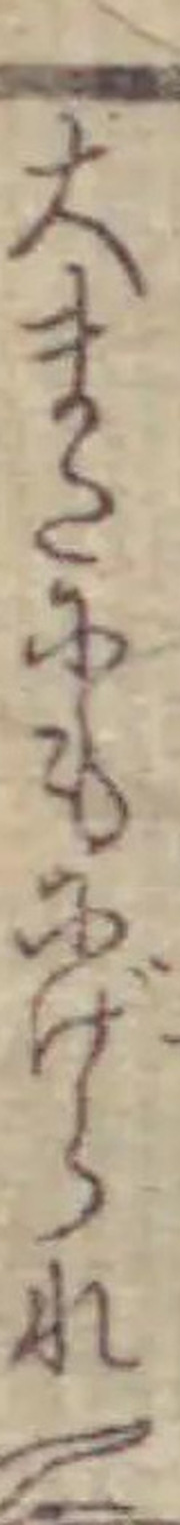大またにもにげられ
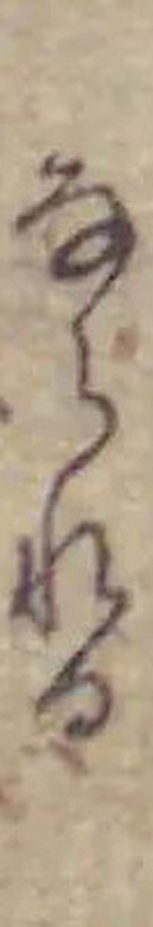なられる
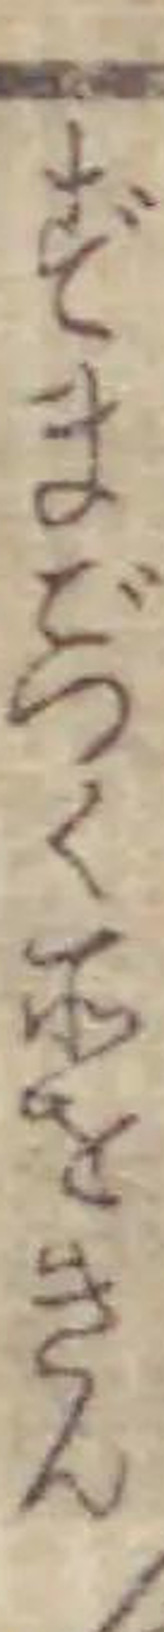ずまごつく所をきん
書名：化物敵討 2巻
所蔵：国立国会図書館 National Diet Library, JAPAN
